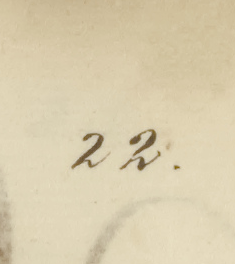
22.
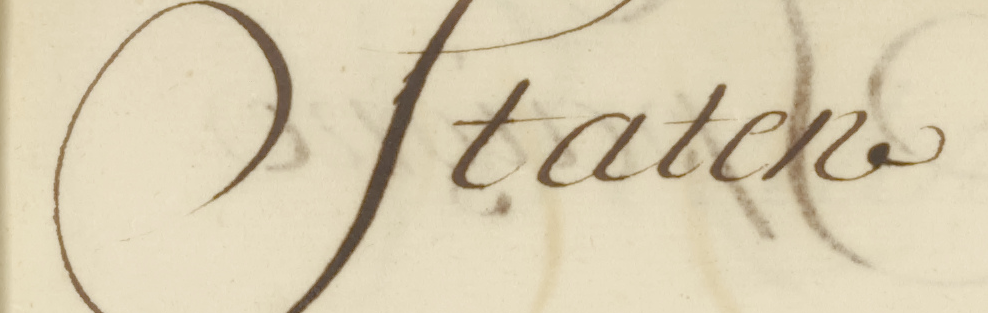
Staten
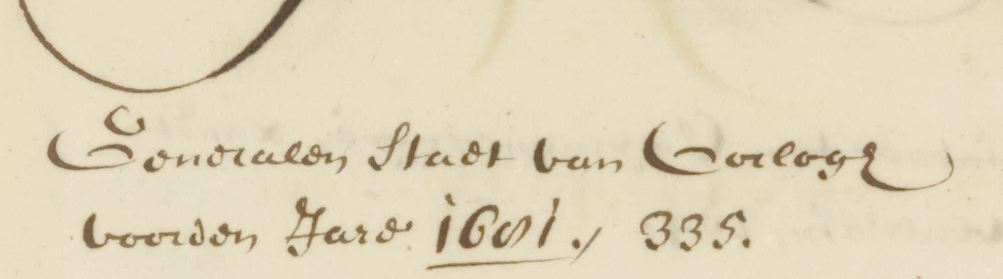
Generalen Staet van Oorlogh
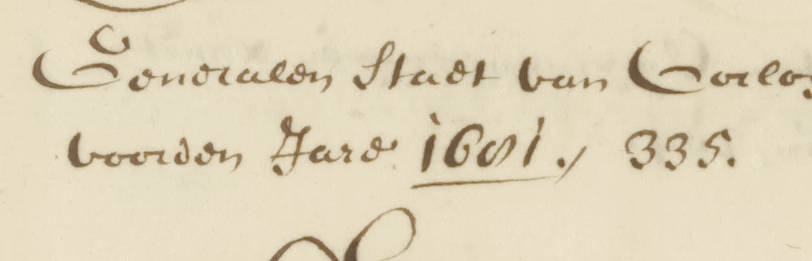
voorden Jare 1681, 335.
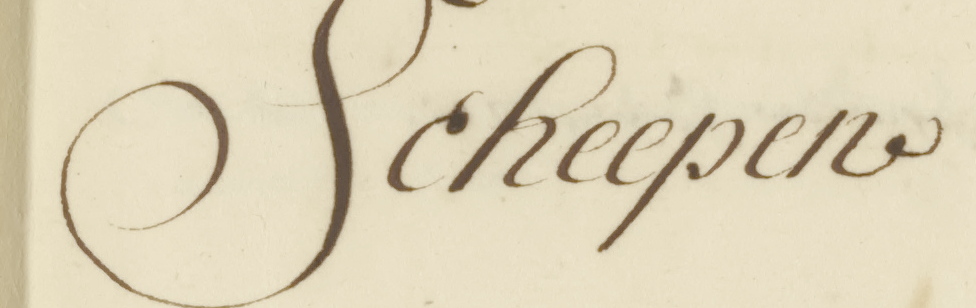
Scheepen
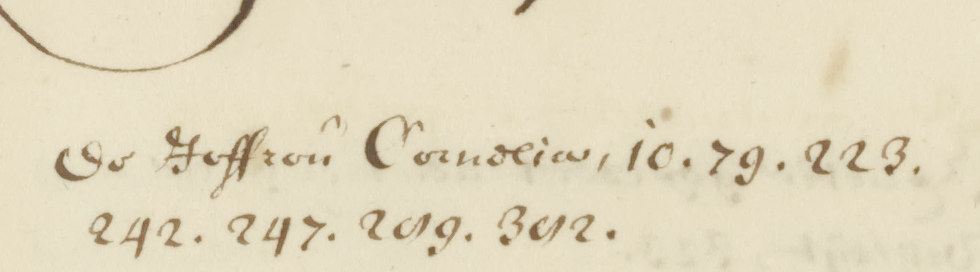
De Joffrou Cornelia, 16, 79, 223.
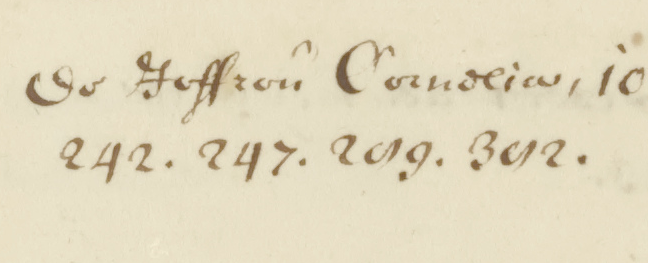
242, 247, 289, 382.
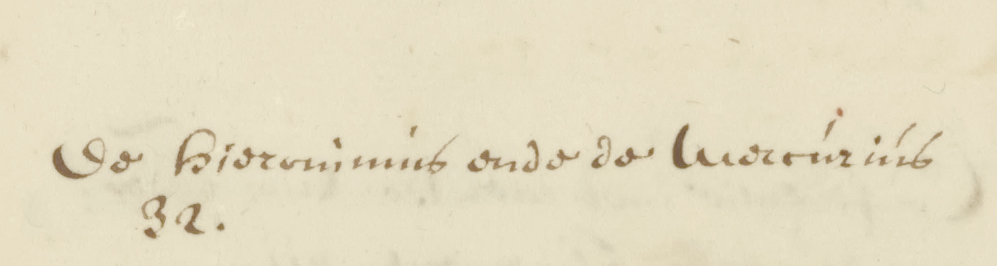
De Hieroimus ende de Mercurius
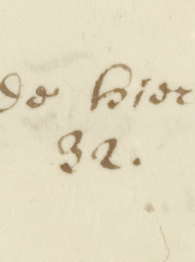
32.
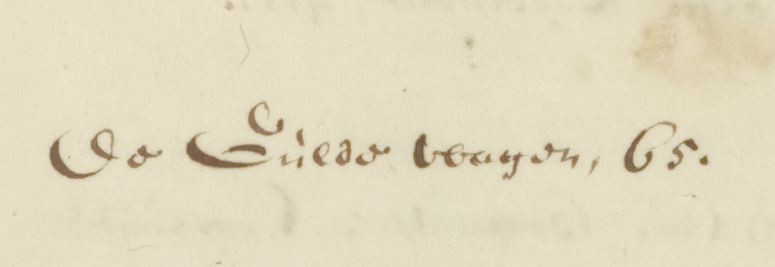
De Gulde wagen, 65.
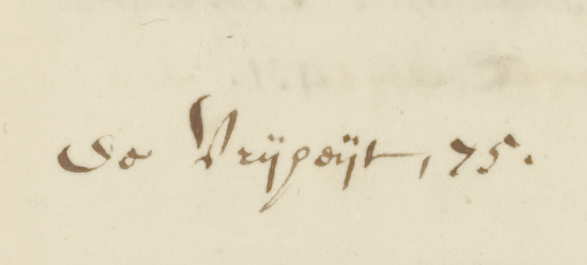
De Vrijheijt, 75.
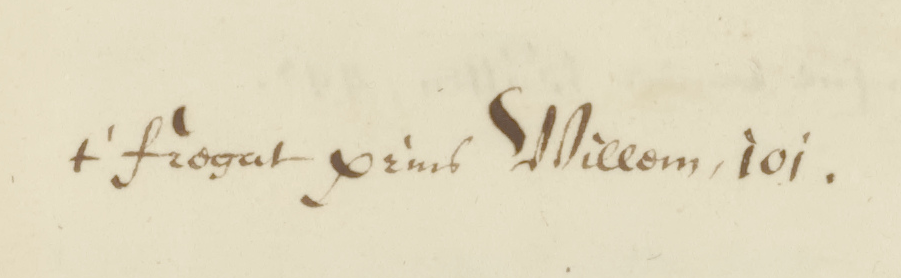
t' Fregat prins Willem, 101.
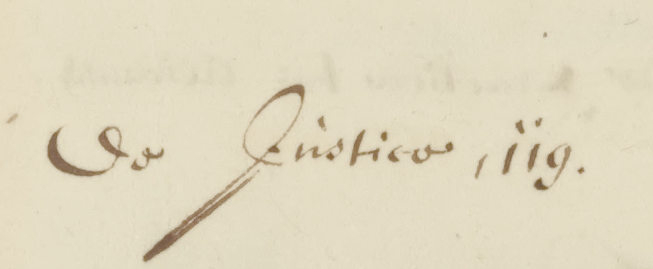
De Justice, 119.
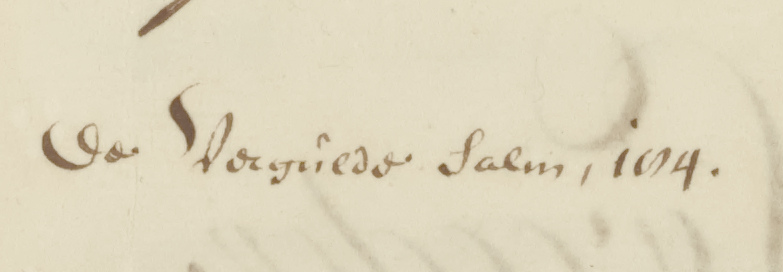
De Vergulde Salm, 184.
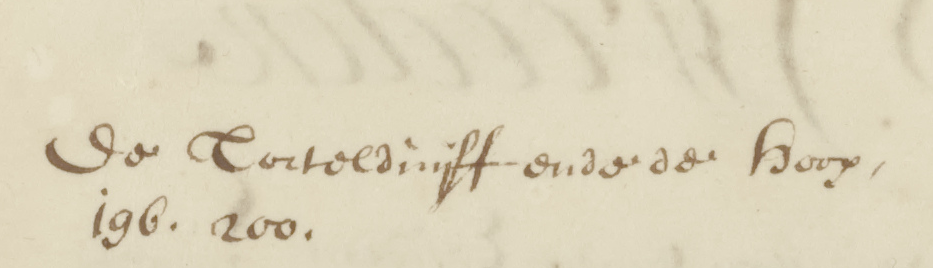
De Tortelduijff ende de Hoop„
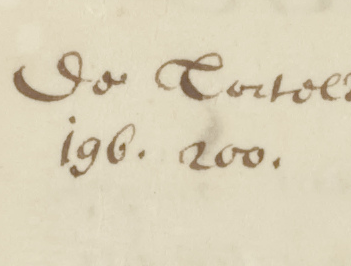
196, 200.
